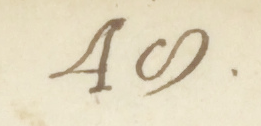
48
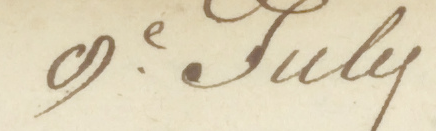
8e. Julij
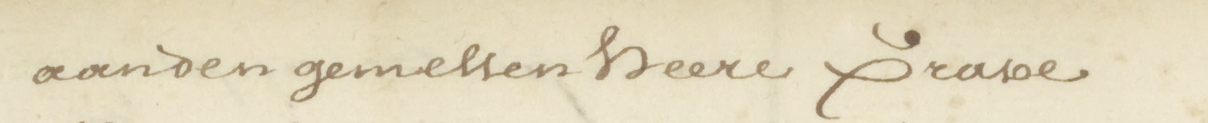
aanden gemelten heere Grave
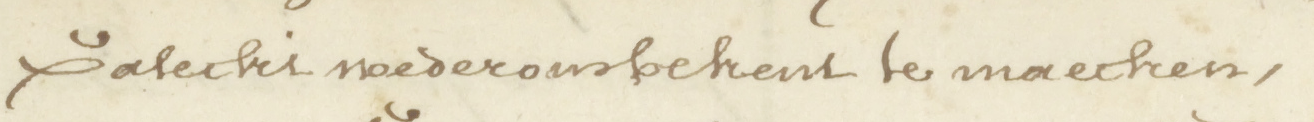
Galecki wederom bekent te maecken,
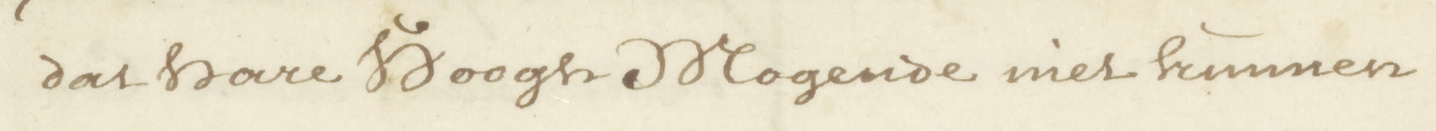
dat hare Hoogh Mogende niet kunnen
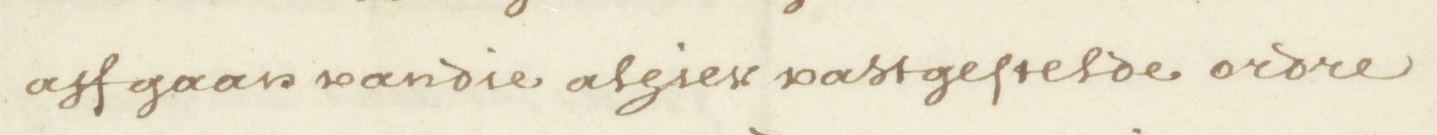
affgaan van die alhier vastgestelde ordre
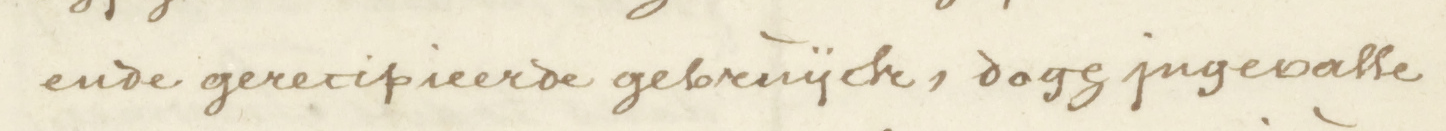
ende gerecipieerde gebruijck, dogh ingevalle
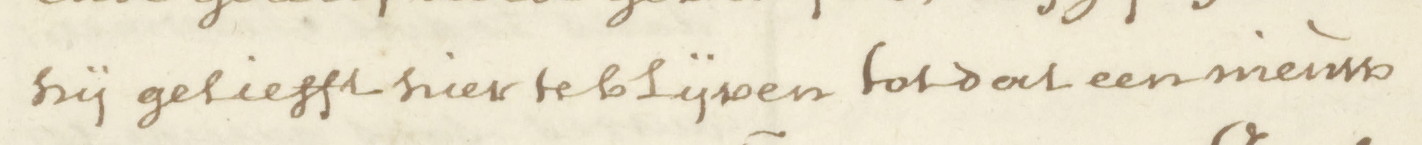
hij geliefft hier te blijven tot dat een nieuw
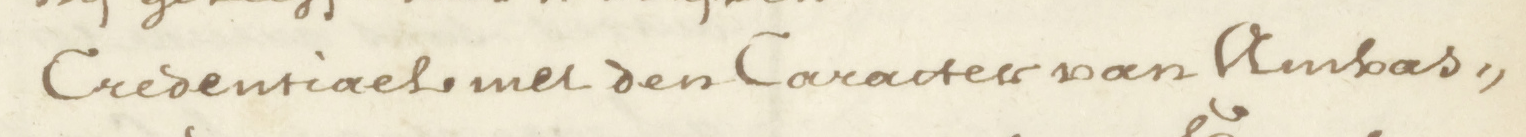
Credentiael met den Caracter van Ambas„
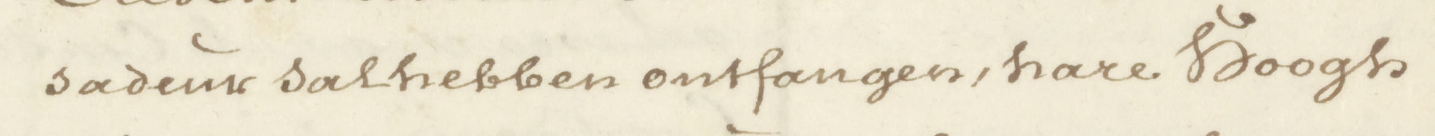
sadeur sal hebben ontfangen, hare Hoogh
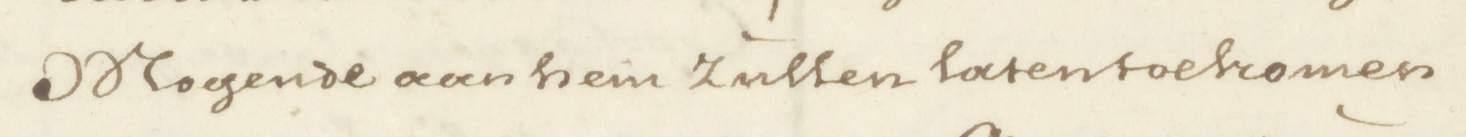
Mogende aan hem zullen laten toekomen
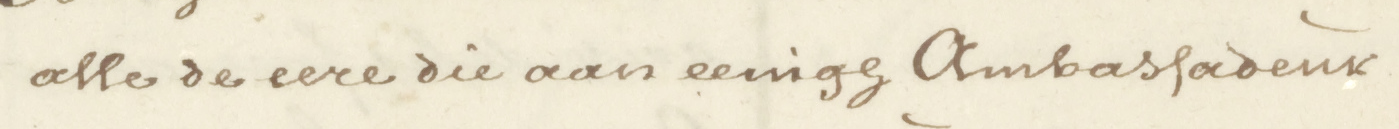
alle de eere die aan eenigh Ambassadeur
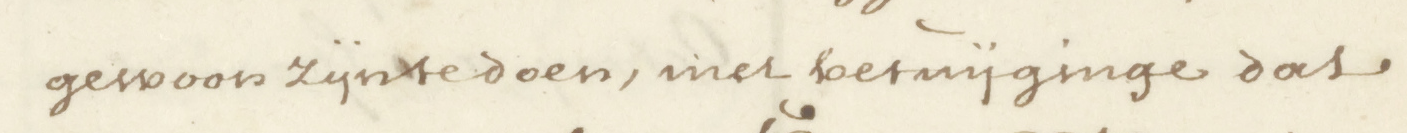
gewoon zijn te doen, met betuijginge dat
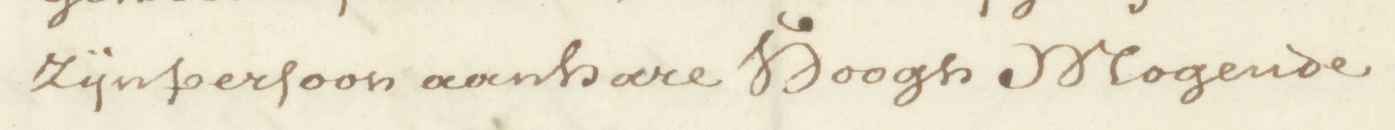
zijn persoon aan hare Hoogh Mogende
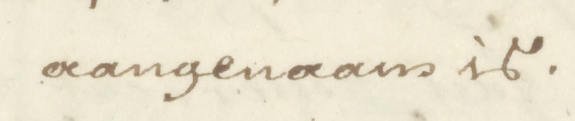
aangenaam is.
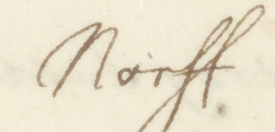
Norff
